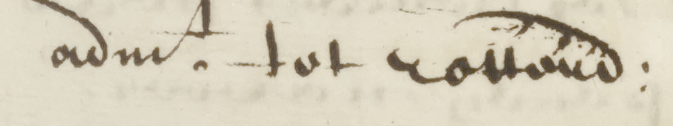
Admt tot Rotterd:
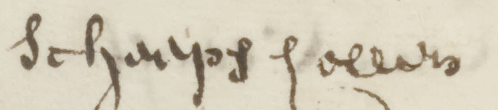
scheepshellen
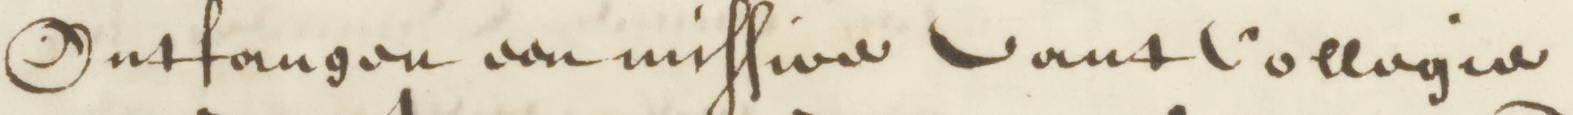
Ontfangen een missive vant Collegie
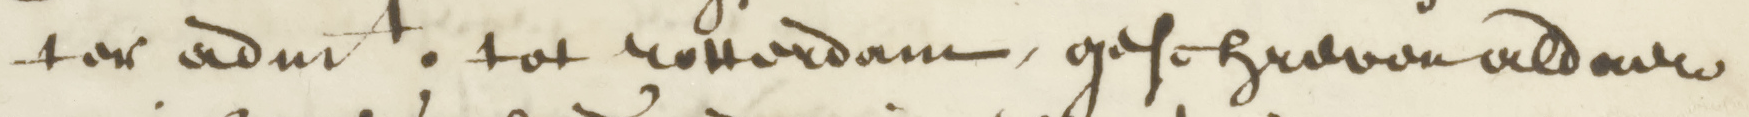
ter Admt tot Rotterdam, geschreven aldaer
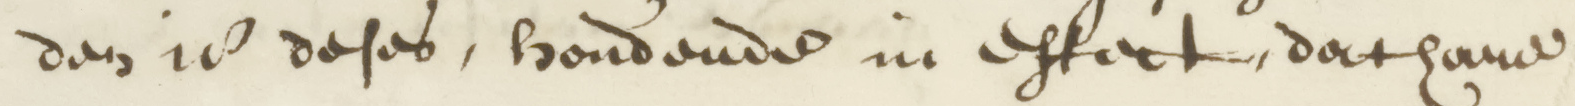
den 18 deses, houdende in effect, dat hare
